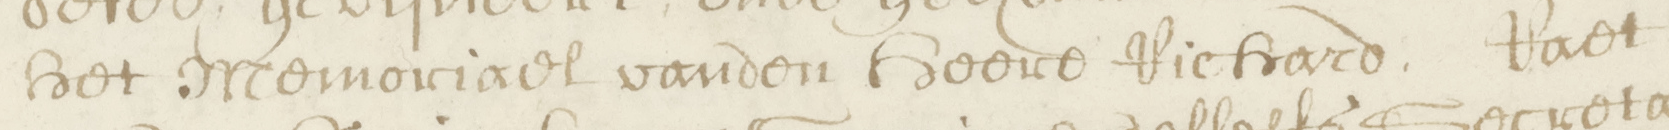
het Memoriael vanden heere Richard, Raet
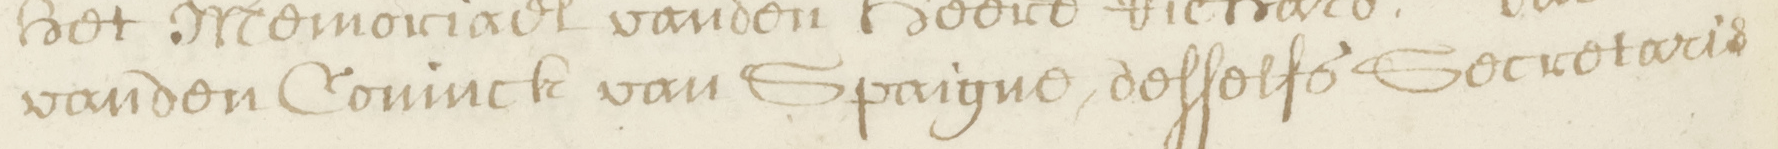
vanden Coninck van Spaigne, desselfs Secretaris
